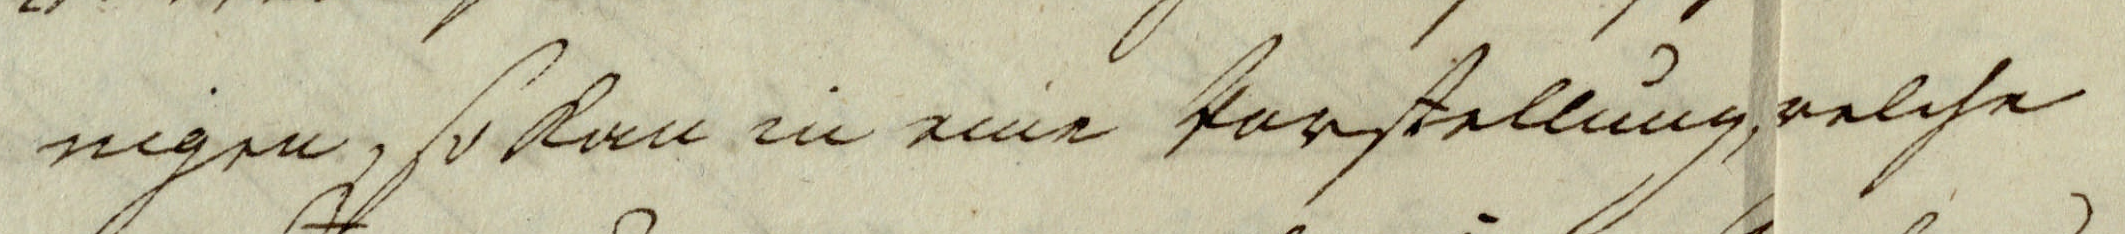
nigen, so kan in eine Vorstellung, welche
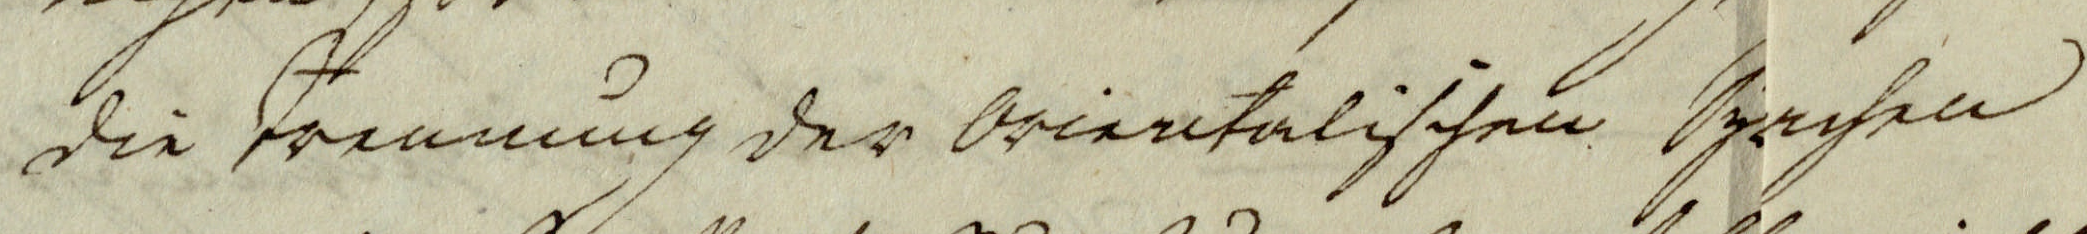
die Trennung der Orientalischen Sprachen
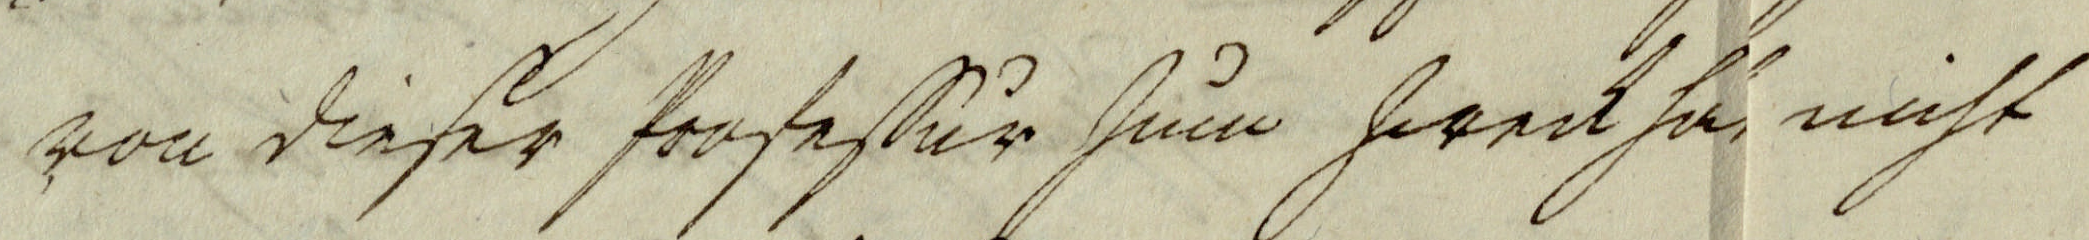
von dieser Professur zum Zweck habe, nicht
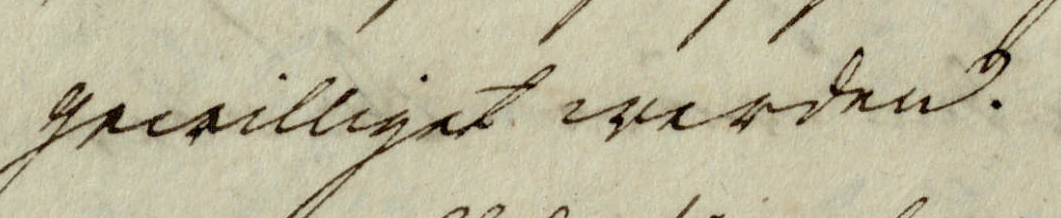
gewilligt werden.
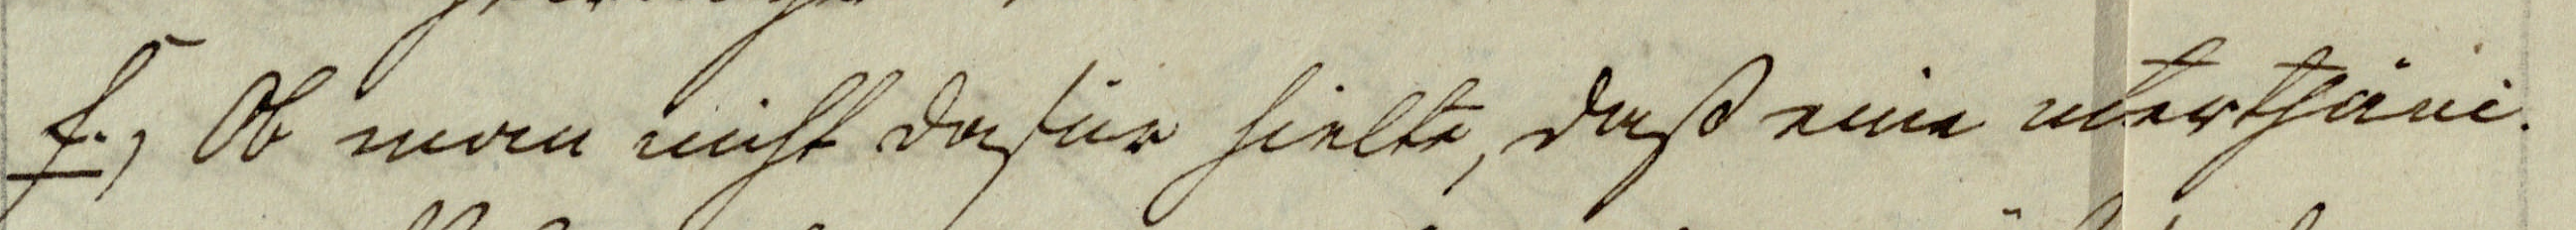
f., Ob man nicht dafür hielte, daß eine unterthäni¬
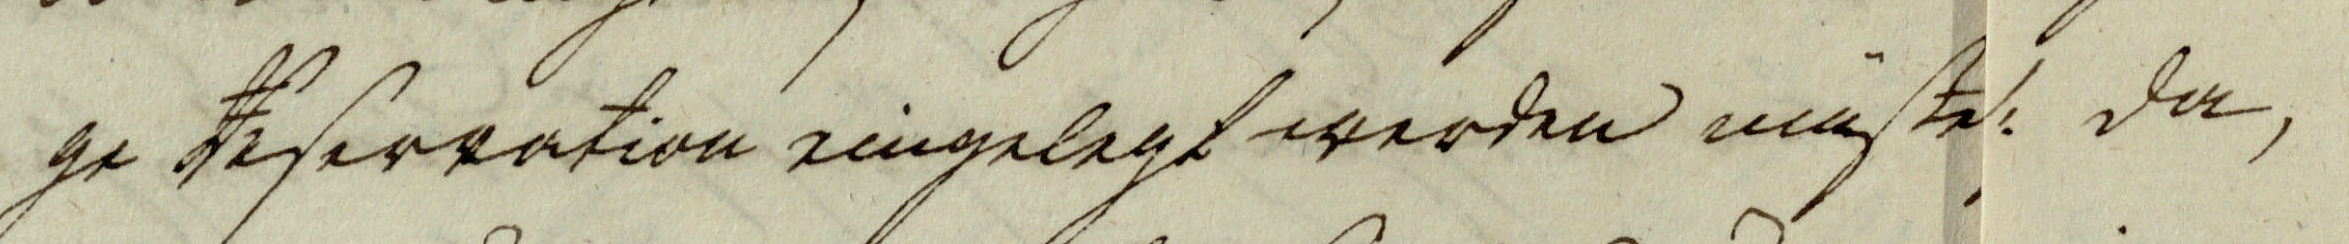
ge Reservation eingelegt werden müßte; da,
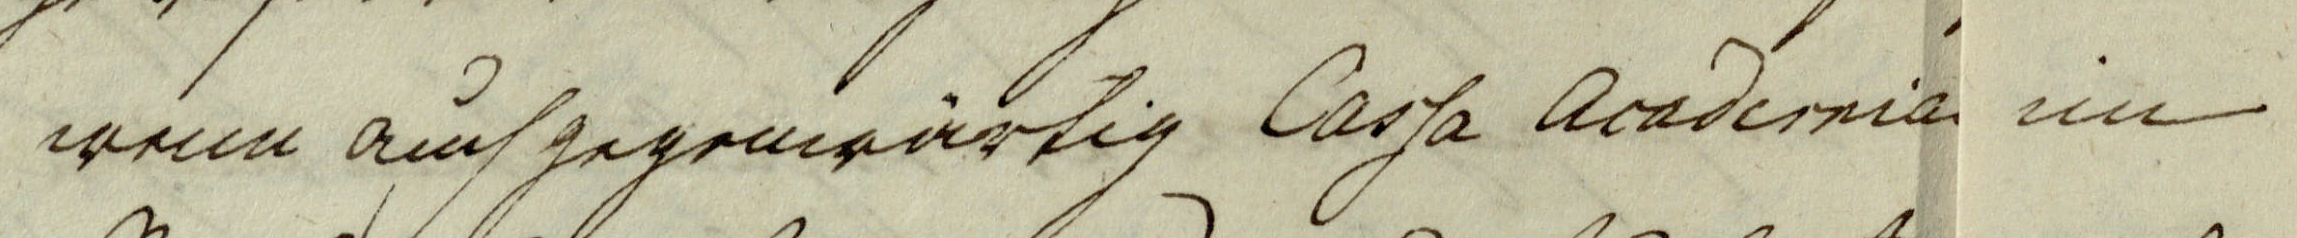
wenn auch gegenwärtig Cassa Academica im
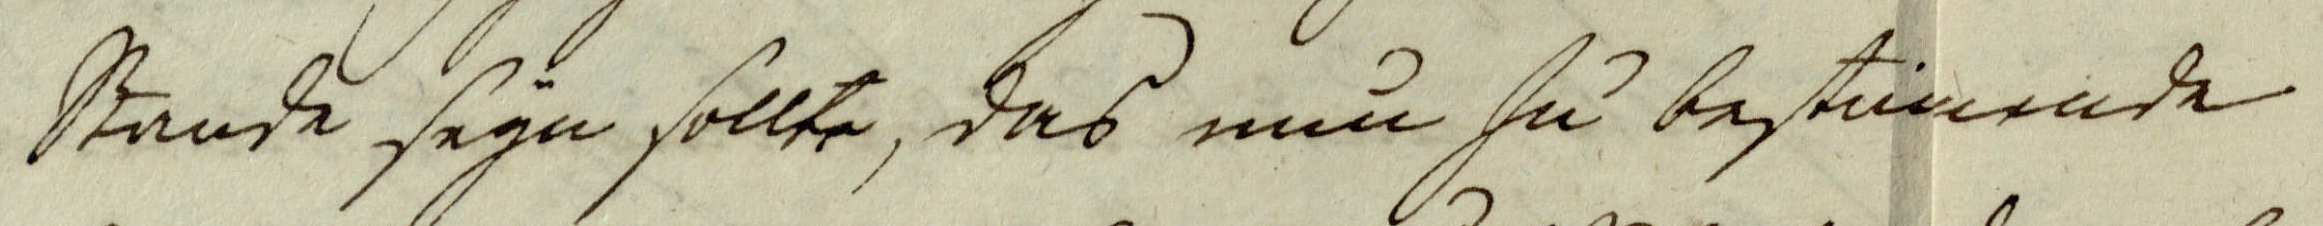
Stande seÿn sollte, das nun zu bestimmende
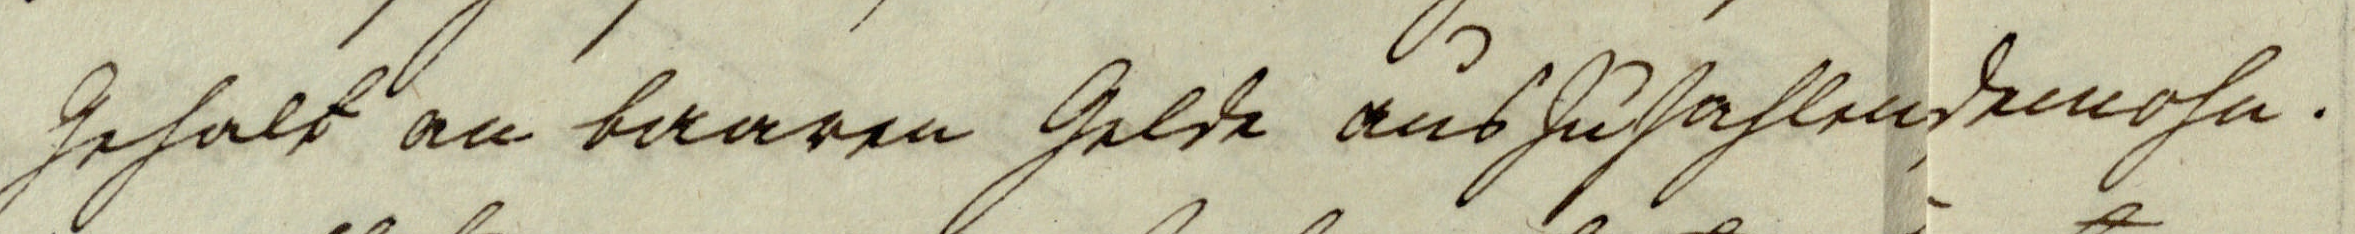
Gehalt an baaren Gelde auszuzahlen, demohn¬
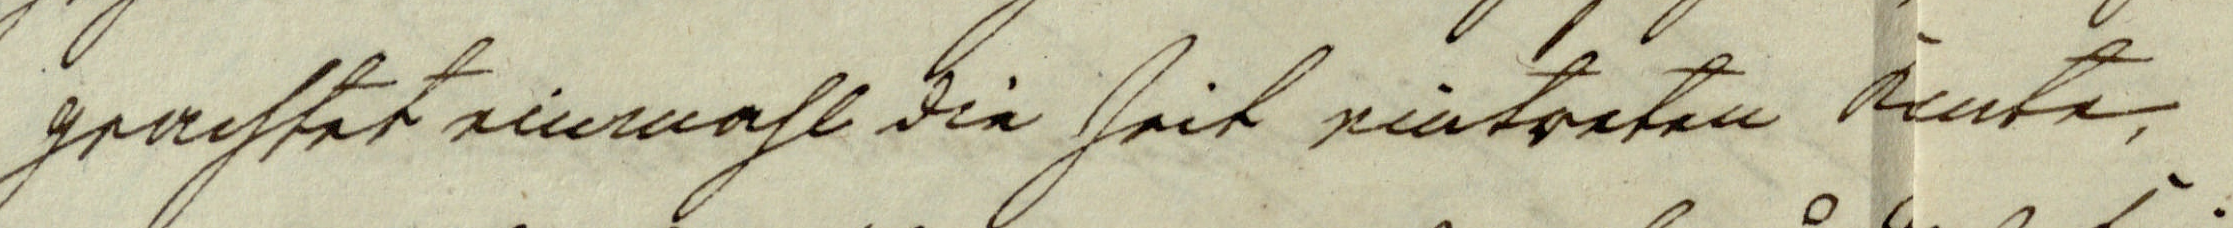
geachtet einmahl die Zeit eintreten könnte,
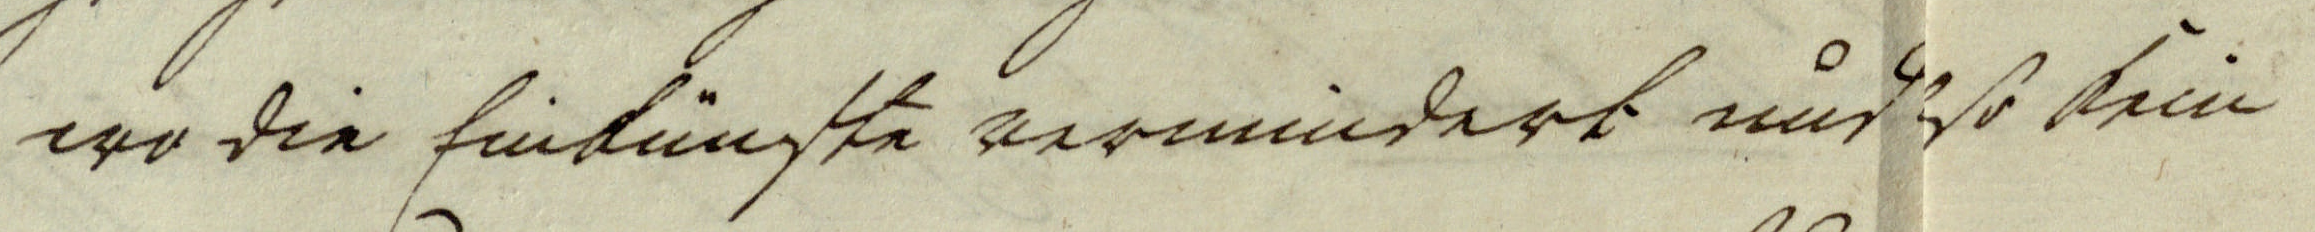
wo die Einkünfte vermindert und also kein
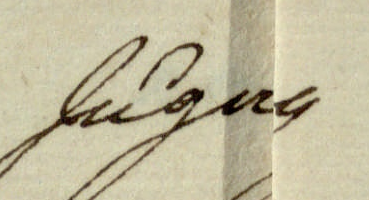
Zugang
